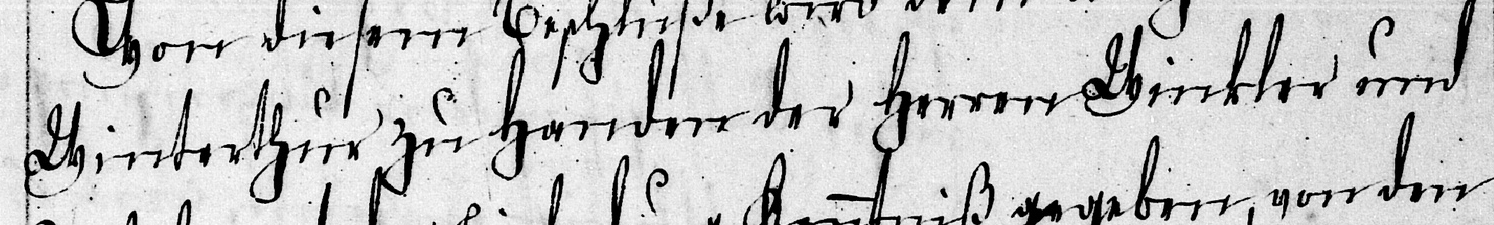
Winterthur zu Handen der Herren Winkler und
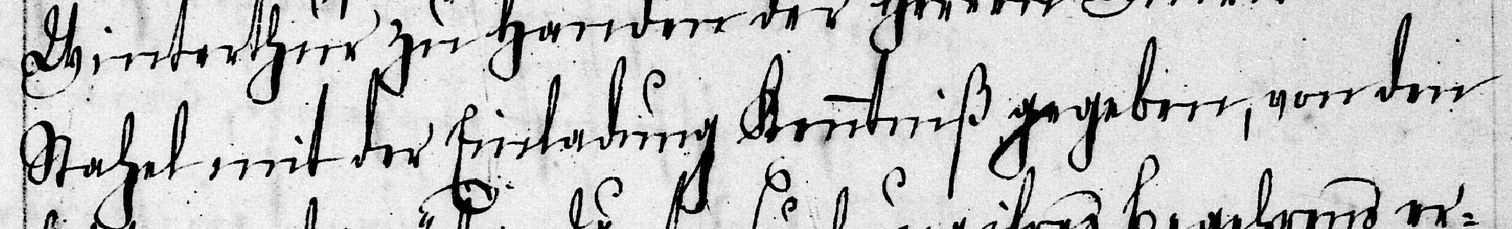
Stahel mit der Einladung Kenntniß gegeben, von den
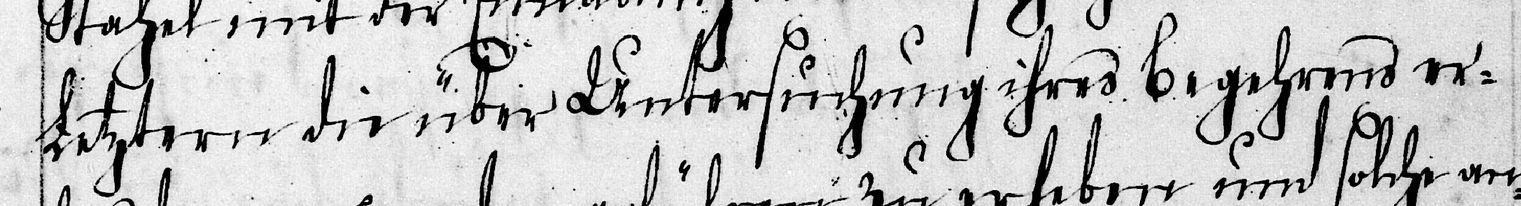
Letztern die über Untersuchung ihres Begehrens er¬
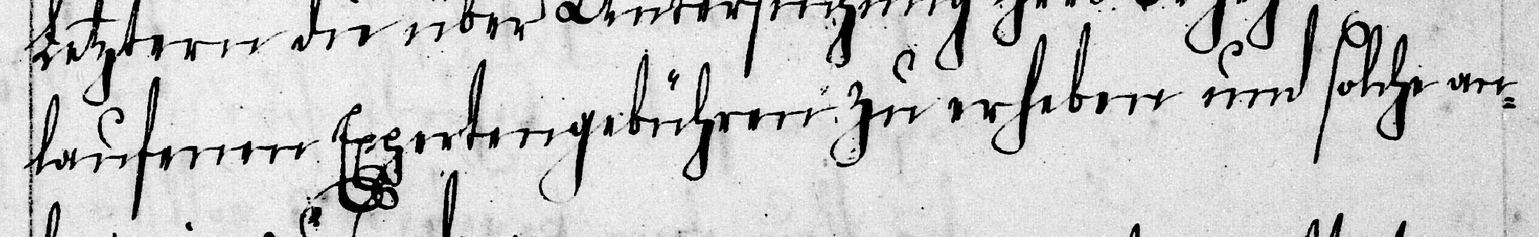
laufenen Expertengebühren zu erheben und solche an¬
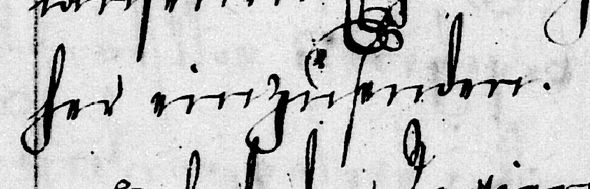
her einzusenden.
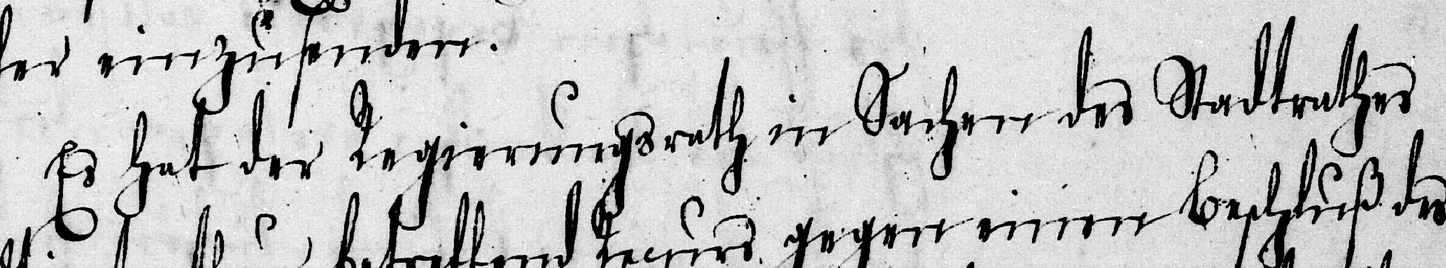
Es hat der Regierungsrath in Sachen des Stadtrathes
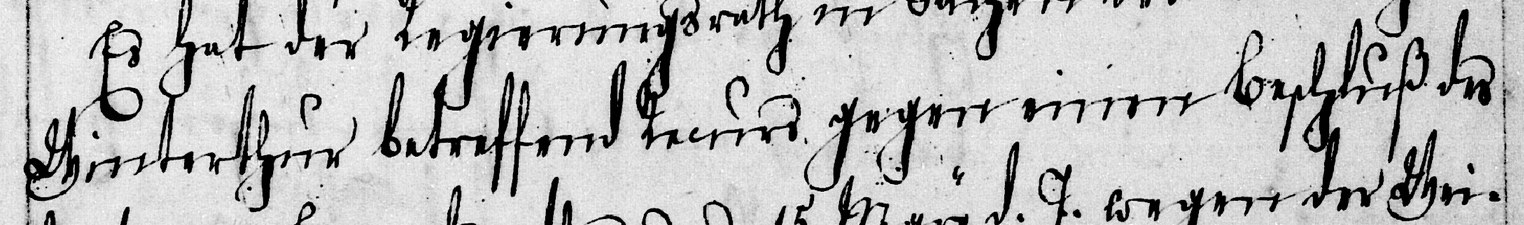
Winterthur betreffend Recurs gegen einen Beschluß des
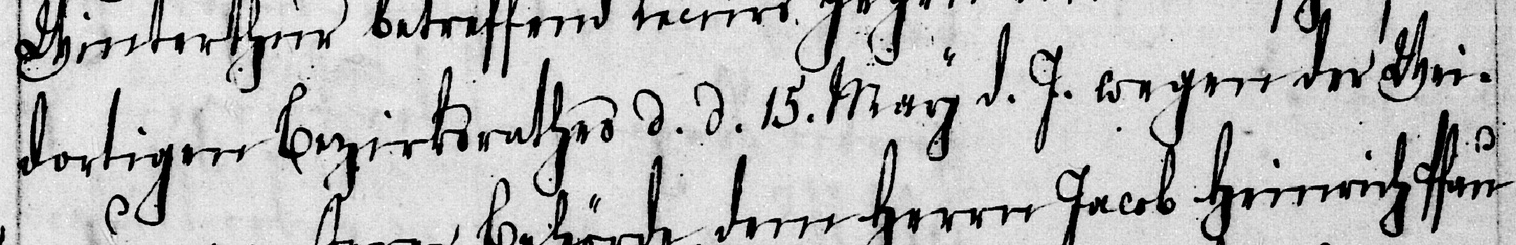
dortigen Bezirksrathes d. d. 15. May d. J. wegen der Wei¬
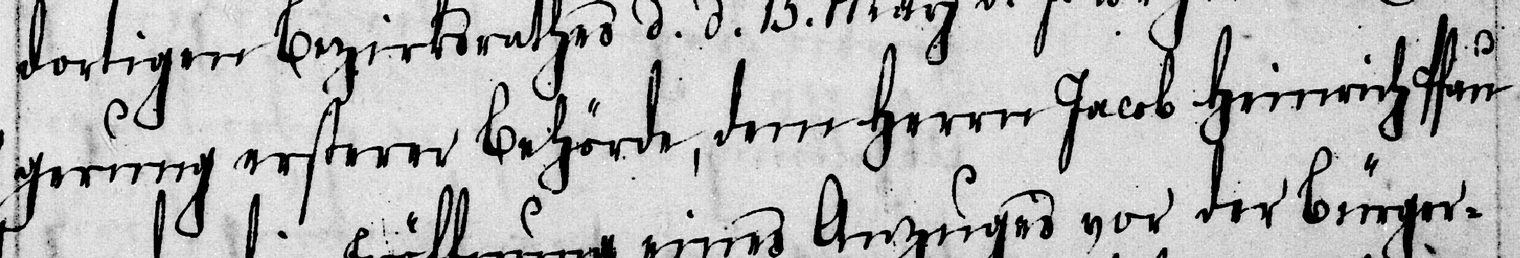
gerung ersterer Behörde, dem Herrn Jacob Heinrich Pfau
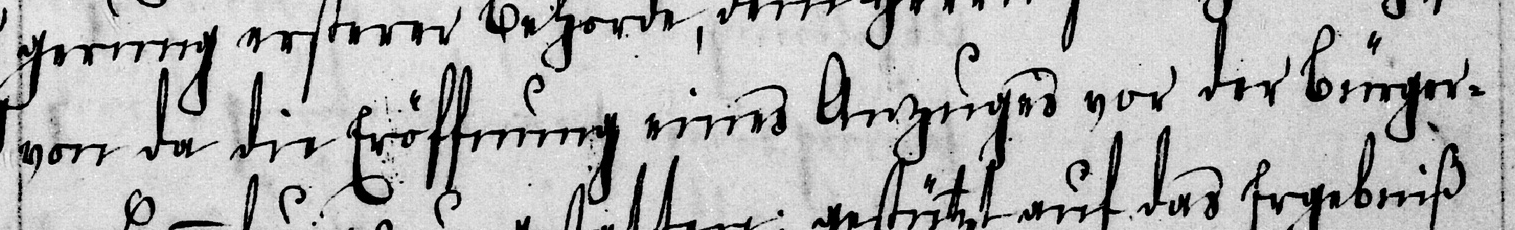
von da die Eröffnung eines Anzuges vor der Bürger¬
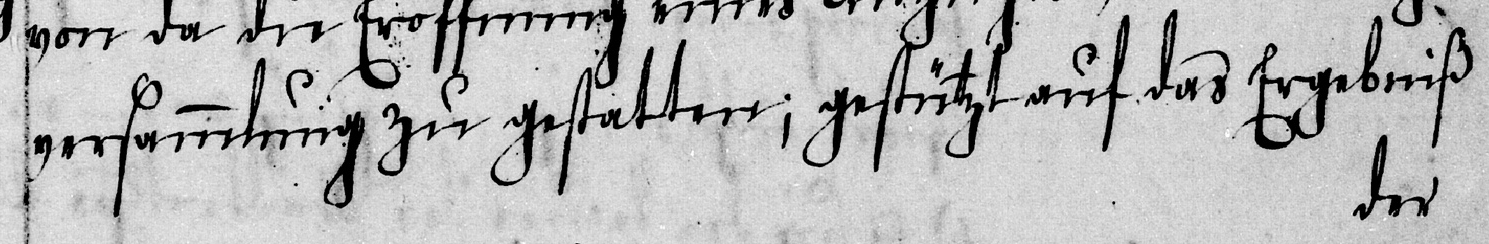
versammlung zu gestatten; gestützt auf das Ergebniß
